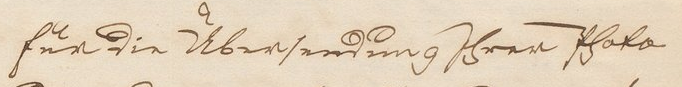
Für die Übersendung Ihrer Photo-
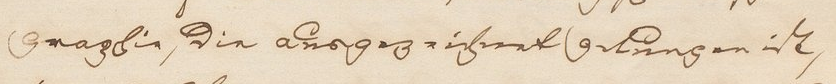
graphie, die ausgezeichnet gelungen ist,
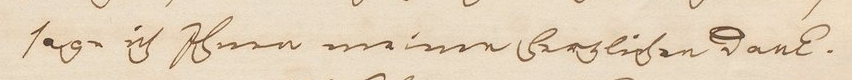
sage ich Ihnen meinen herzlichen Dank.
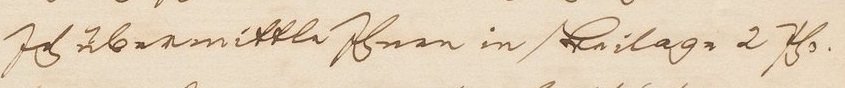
Ich übermittle Ihnen in Beilage 2 Pho-
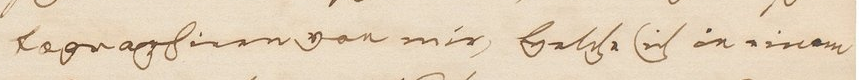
tographieen von mir, welche ich in einem
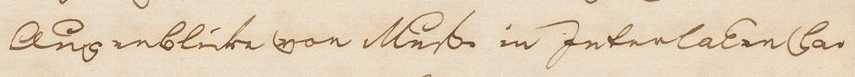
Augenblicke von Muße in Interlaken ha-
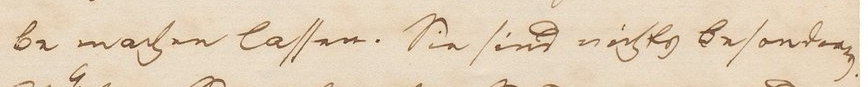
be machen lassen. Sie sind nichts besonderes.
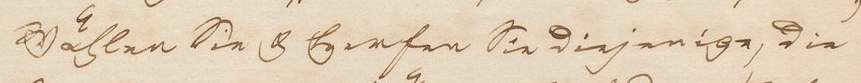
Wählen Sie & werfen Sie diejenige, die
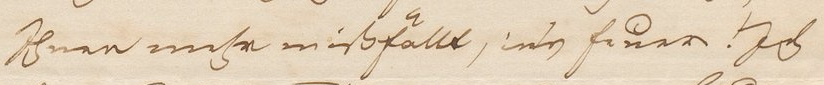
Ihnen mehr mißfällt, in's Feuer! Ich
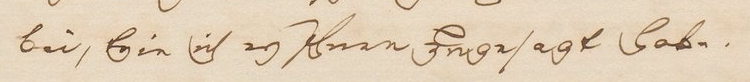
bei, wie ich es Ihnen zugesagt habe.
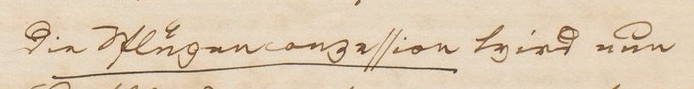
Die Splügenconzession wird nun
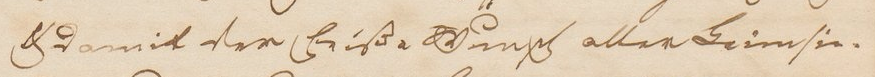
damit der heiße Wunsch aller Leimsie-
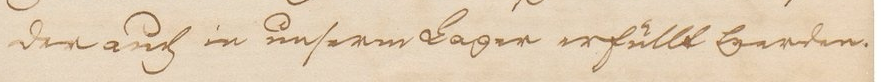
der auch in unserm Lager erfüllt werden.
